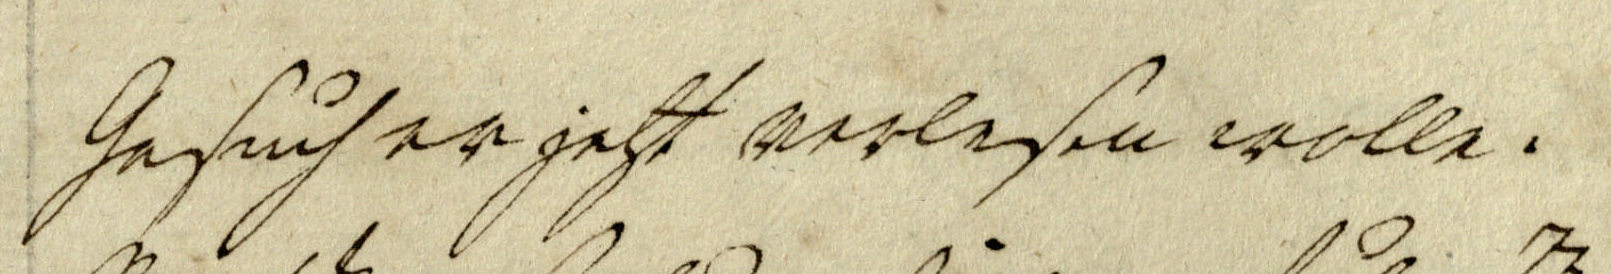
Gesuch er jetzt verlesen wolle.
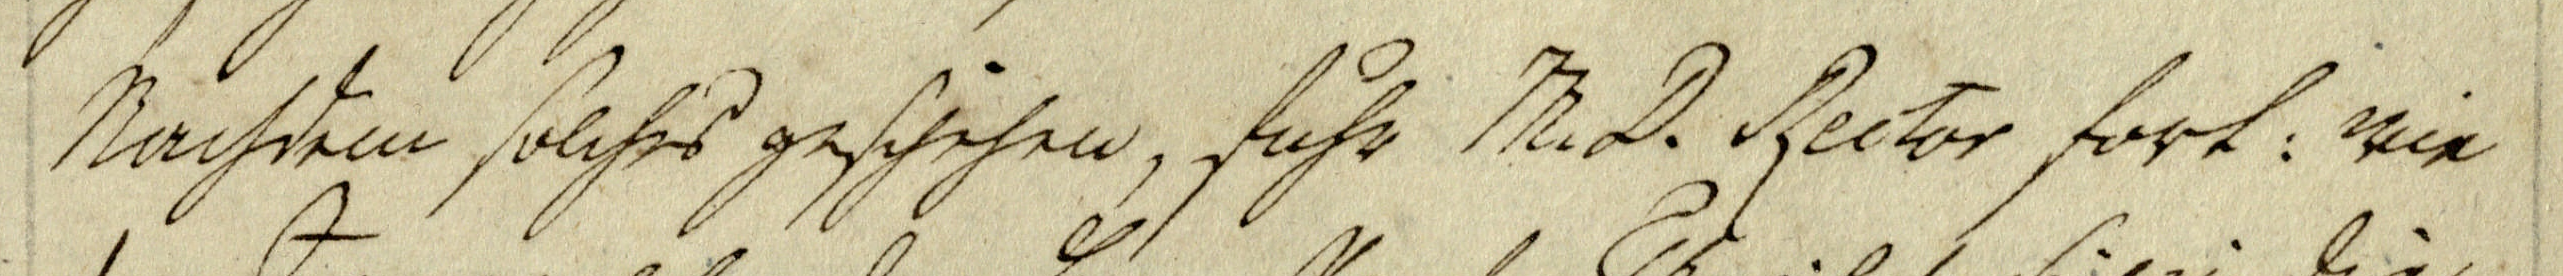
Nachdem solches geschehen, fuhr M. D. Rector fort: wie
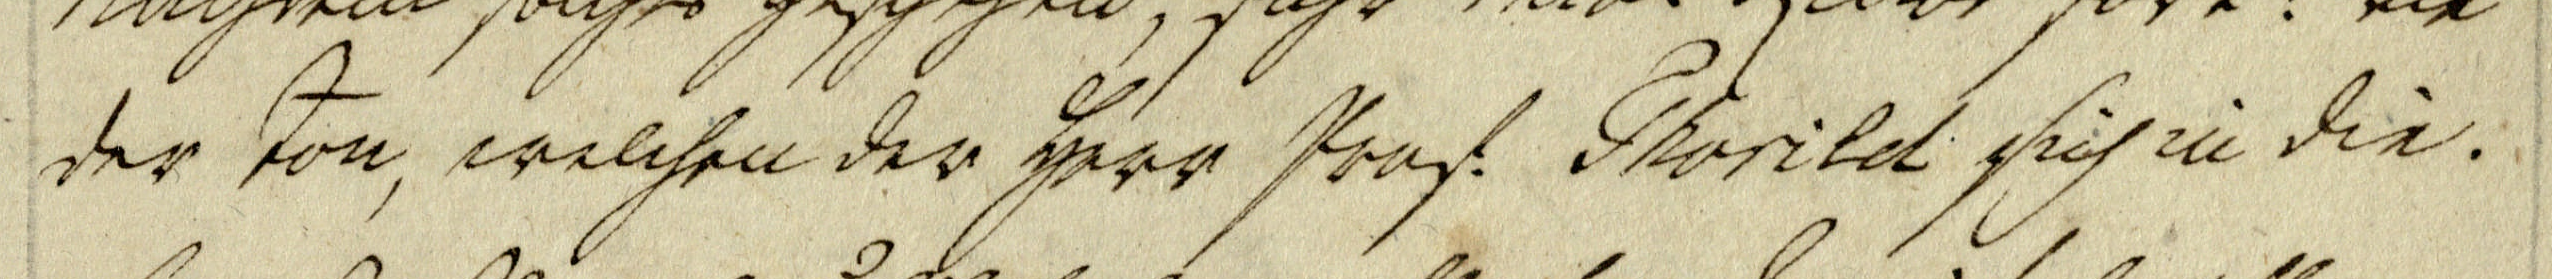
der Ton, welchen der Herr Prof. Thorild sich in die¬
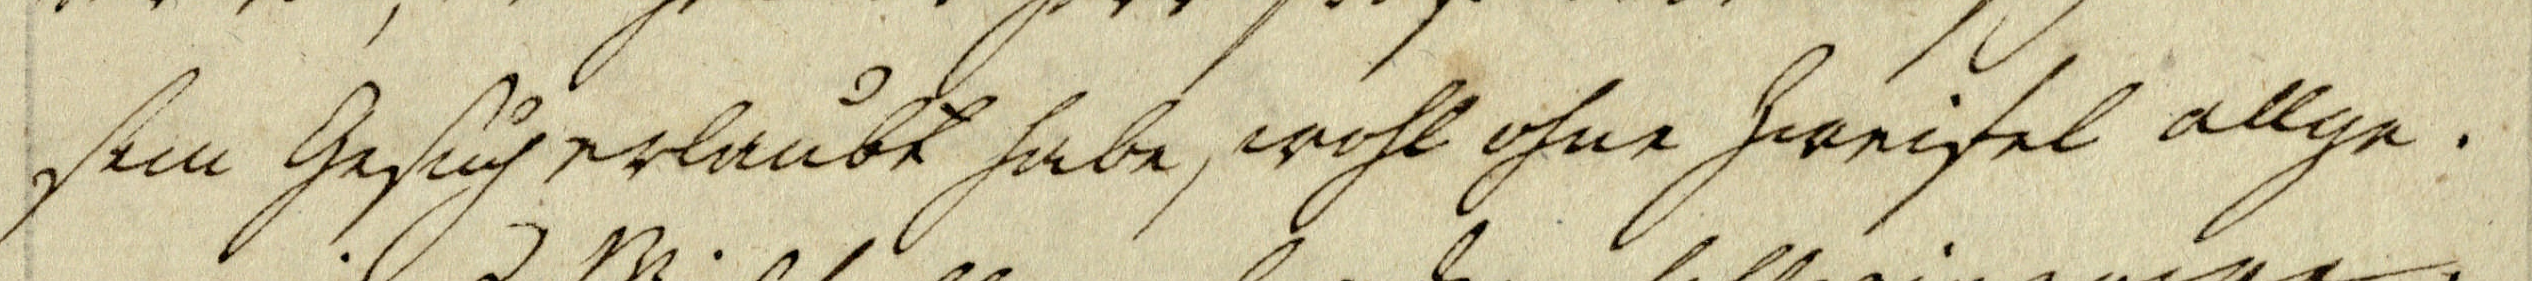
sem Gesuch erlaubt habe, wohl ohne Zweifel allge¬
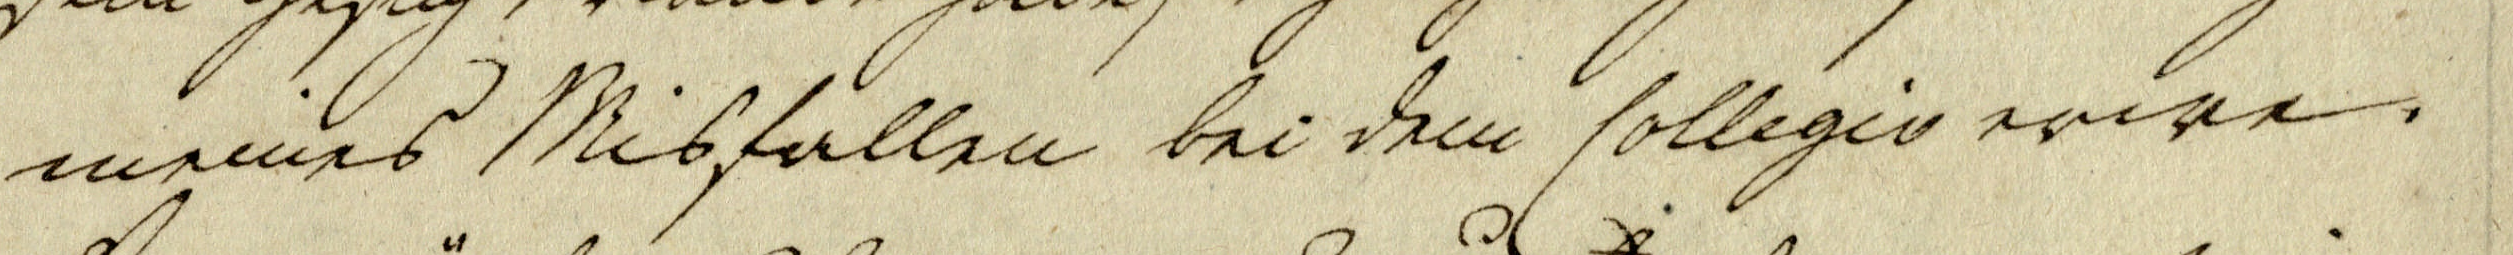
meines Misfallen bei dem Collegio erwe¬
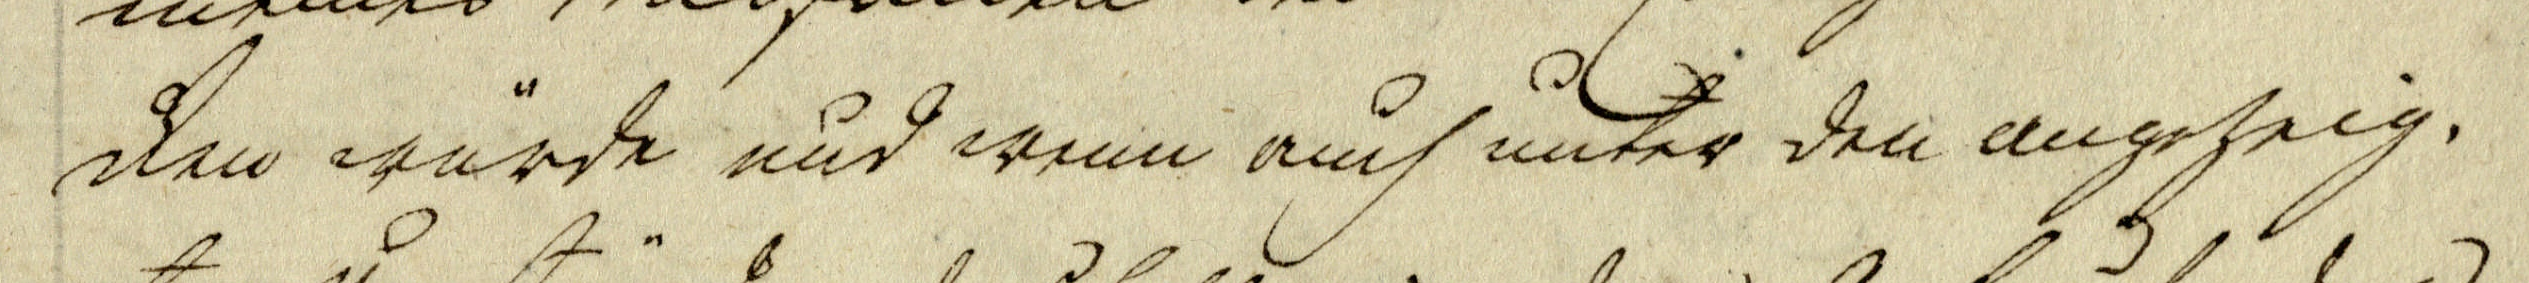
cken würde und wenn auch unter den angezeig¬
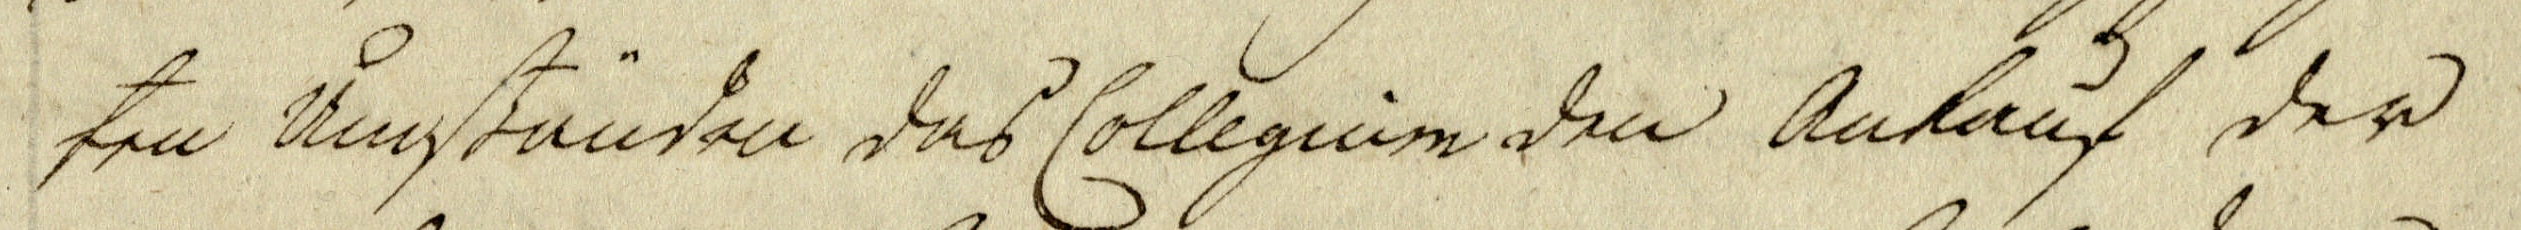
ten Umständen das Collegium den Ankauf der
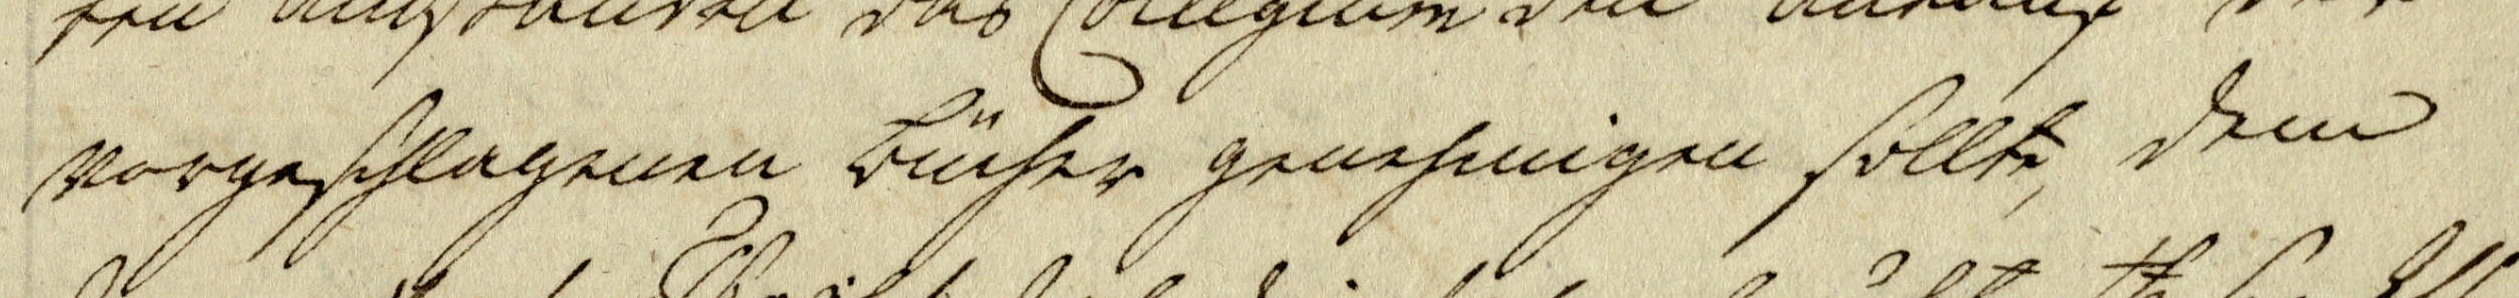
vorgeschlagenen Bücher genehmigen sollte, dem
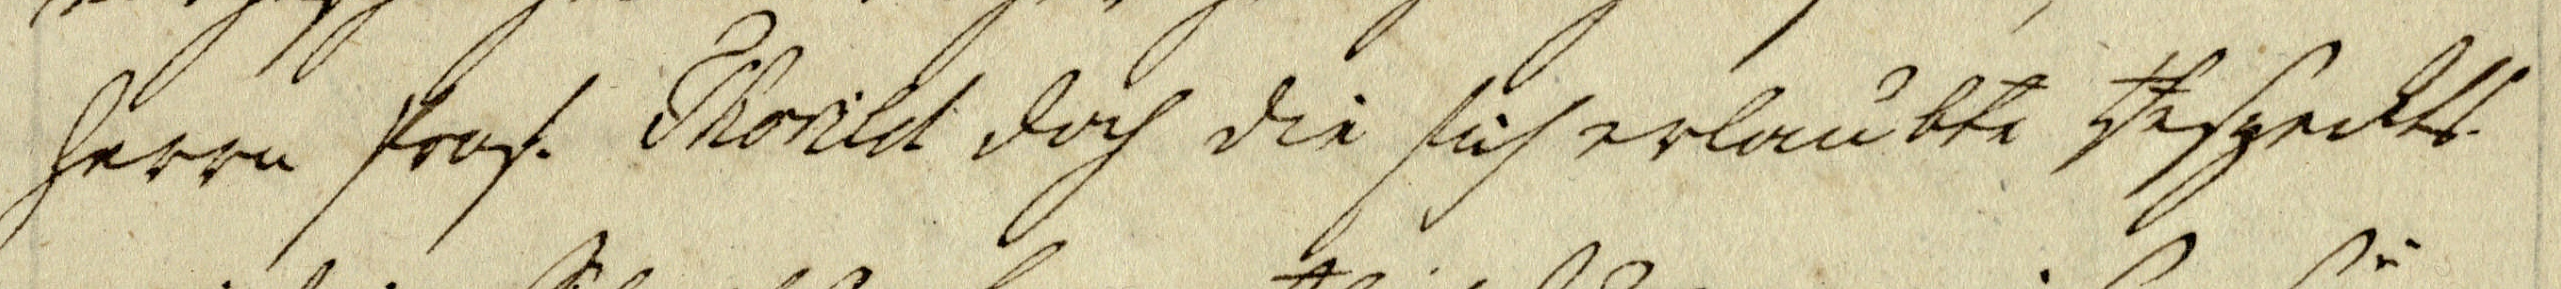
Herrn Prof. Thorild doch die sich erlaubte Respeckts¬
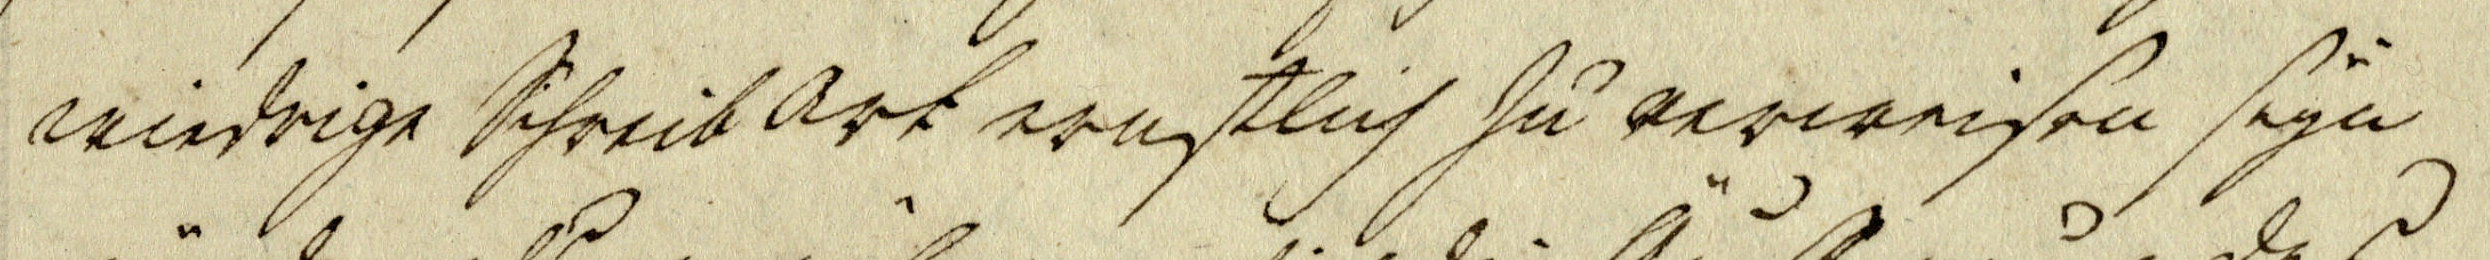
wiedrige SchreibArt ernstlich zu verweisen seÿn
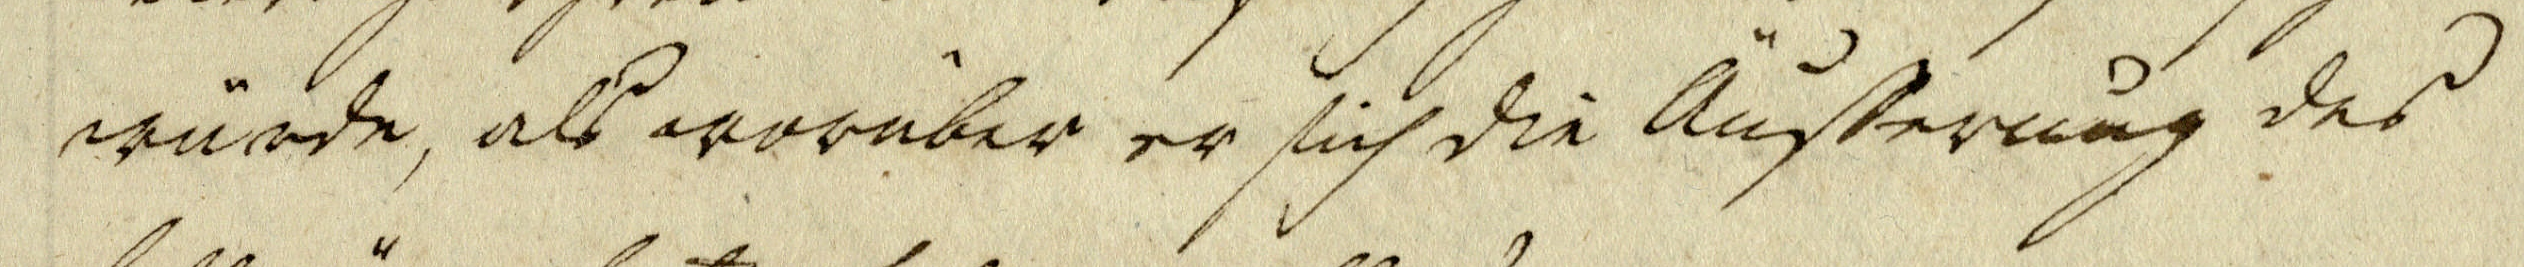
würde, als worüber er sich die Äusserung des
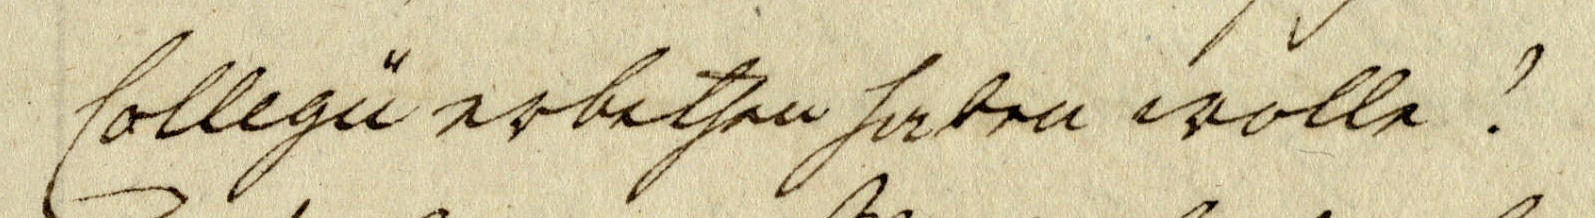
Collegii erbethen haben wolle!
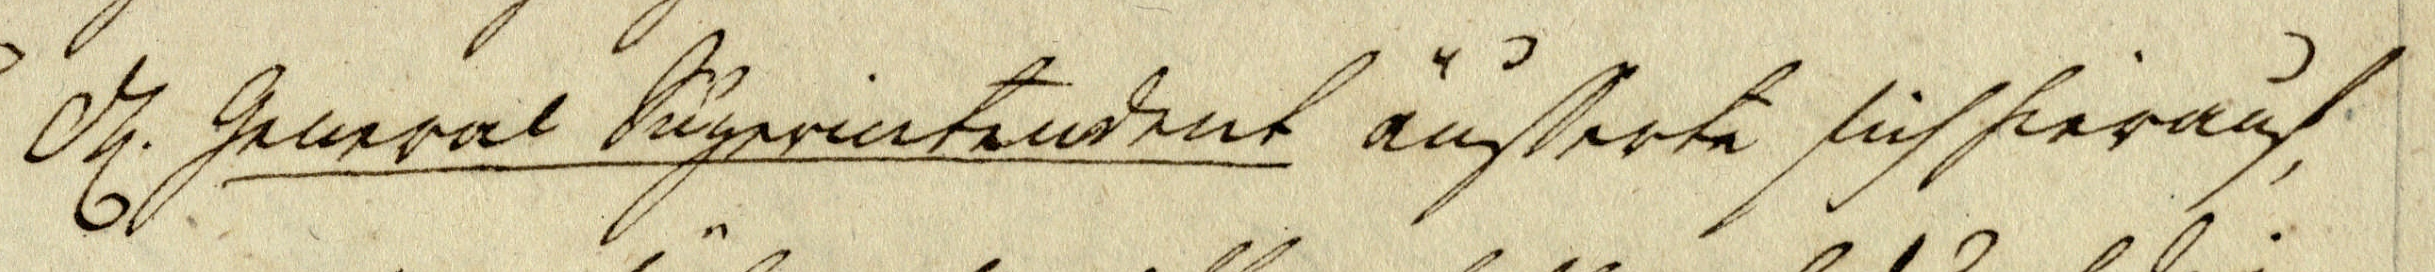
dh. General Superintendent äusserte sich hierauf,
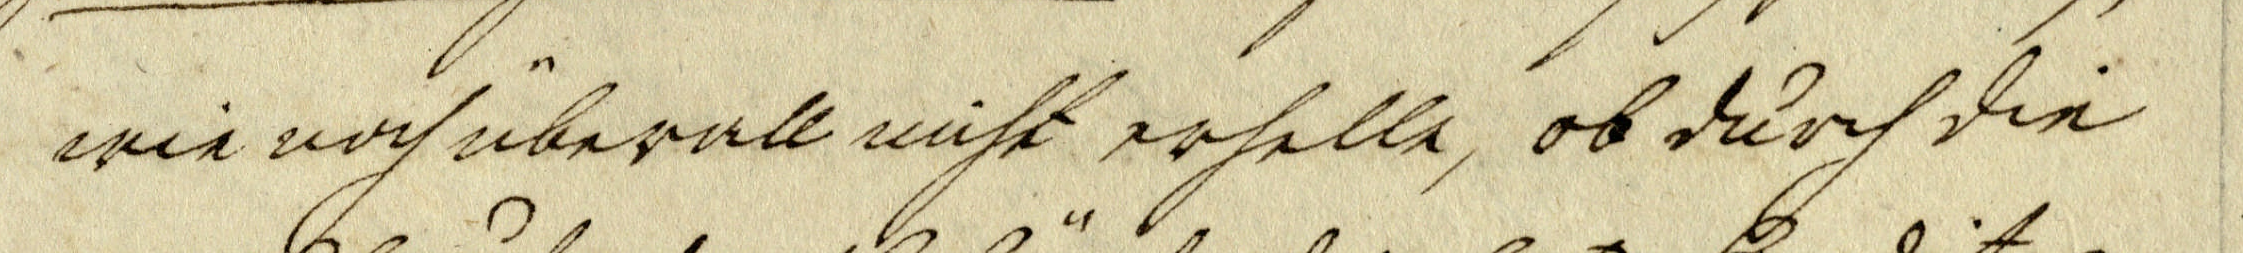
wie noch überall nicht erhelle, ob durch die
